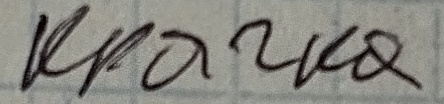крачка
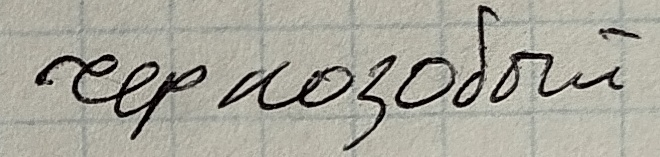чернозобый
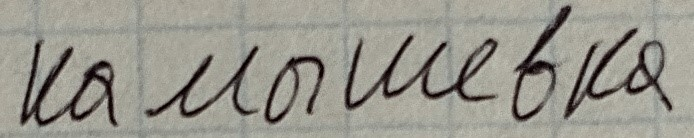камышевка
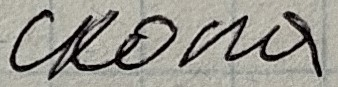скопа
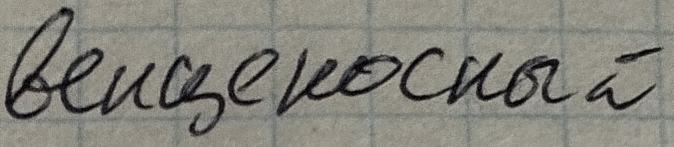венценосный
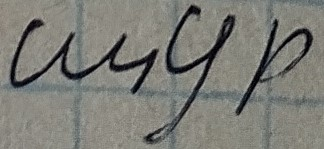щур
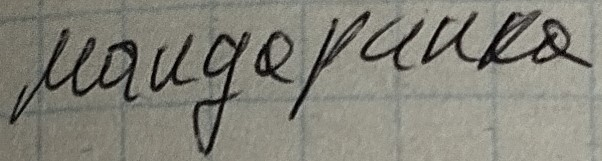мандаринка
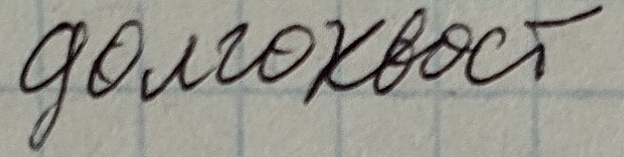долгохвост
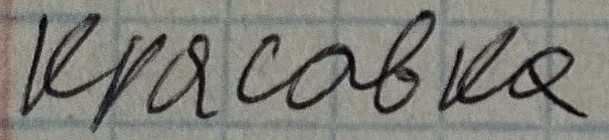красавка
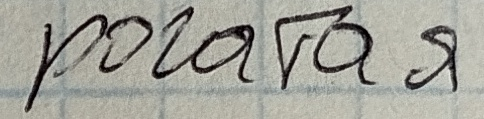рогатая
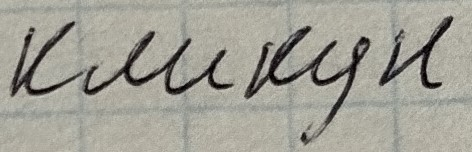кликун
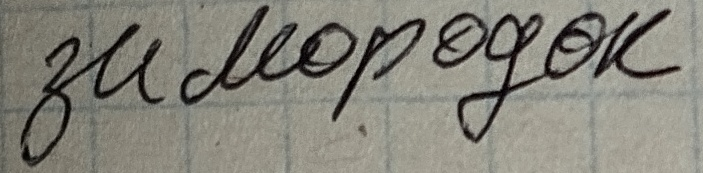зимородок
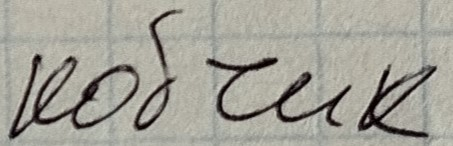кобчик
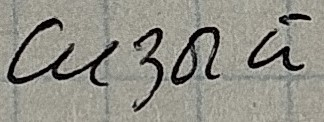сизый
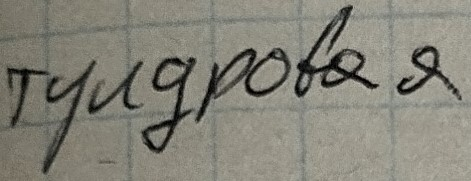тундровая
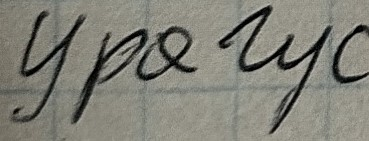урагус
